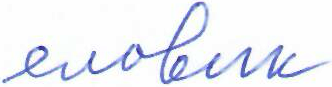еловик
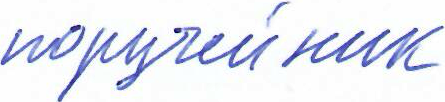поручейник
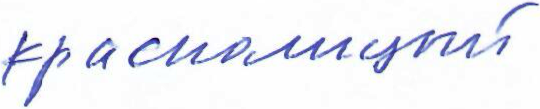краснолицый
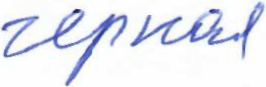черная
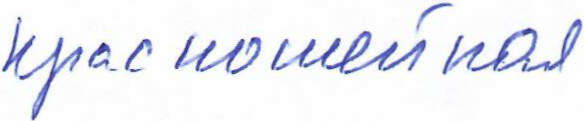красношейная
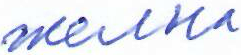желна
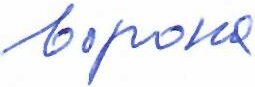ворона
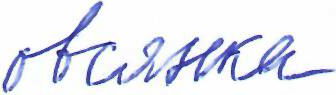овсянка
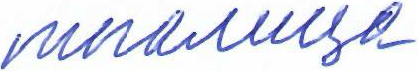пигалица
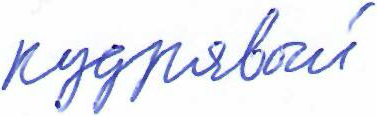кудрявый
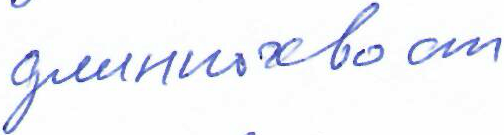длиннохвост
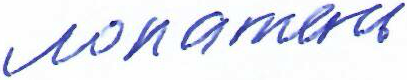лопатень
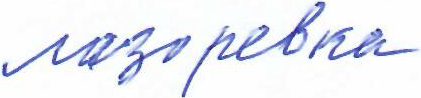лазо ревка
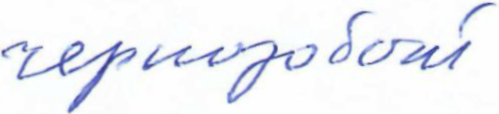чернозобый
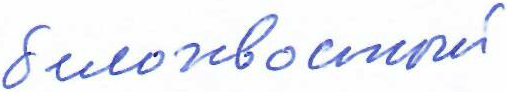белохвостый
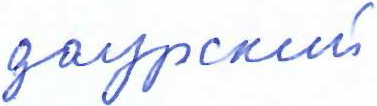даурский
